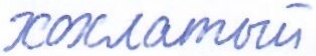хохлатый
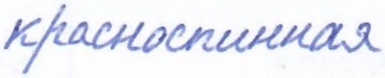красноспинная
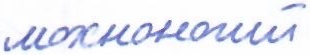мохноногий
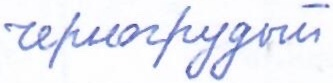черногрудый
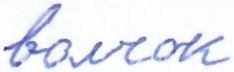волчок
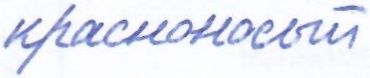красноносый
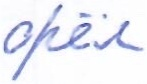орёл
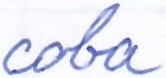сова
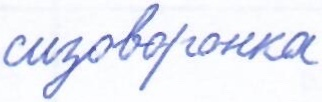сизоворонка
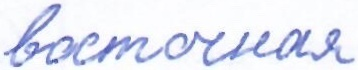восточная
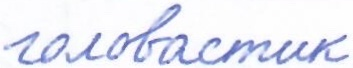головастик
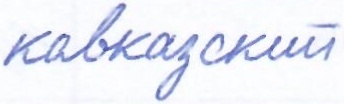кавказский
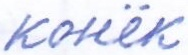конёк
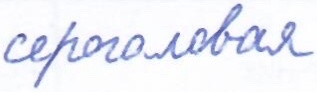сероголовая
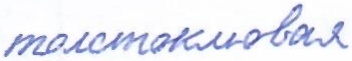толстоклювая
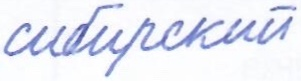сибирский
